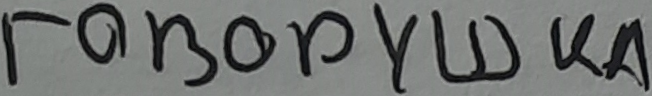говорушка
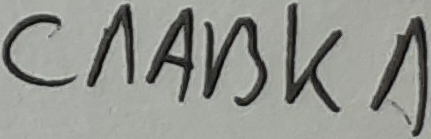славка
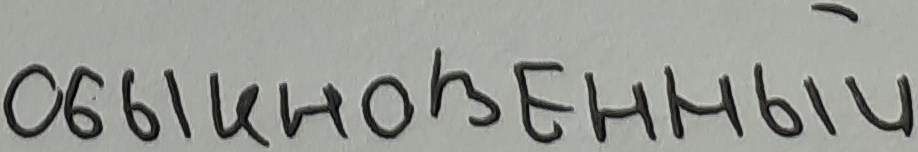обыкновенный
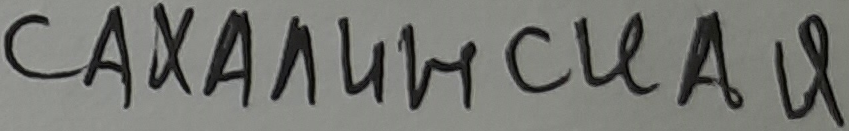сахалинская
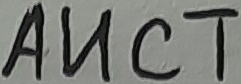аист
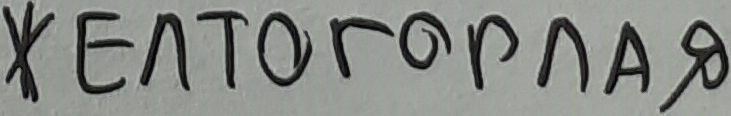желтогорлая
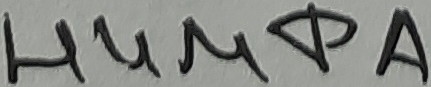нимфа
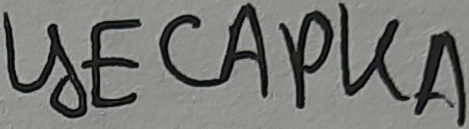цесарка
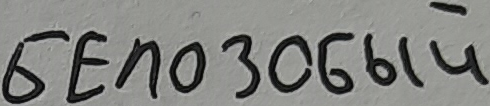белозобый
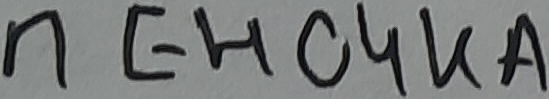пеночка
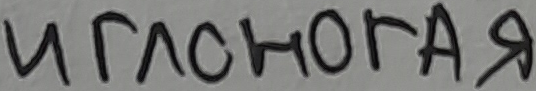иглоногая
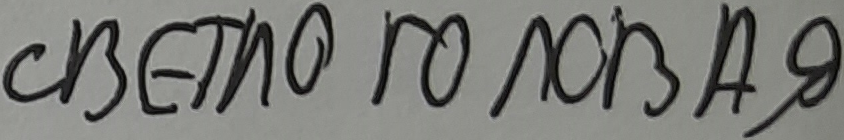светлоголовая
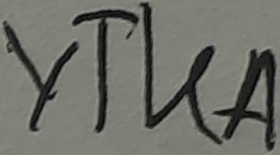утка
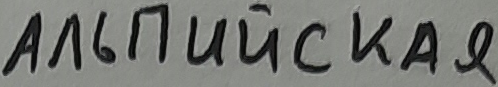альпийская
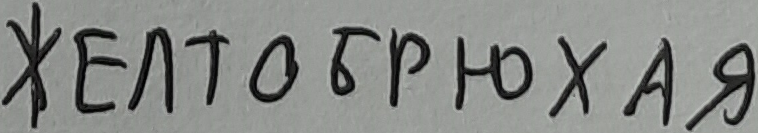желтобрюхая
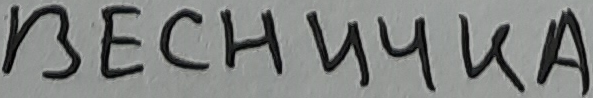весничка
